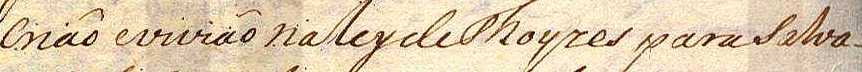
crião e viviaõ na ley de Moyzes para salva
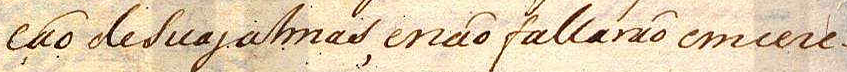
çaõ de Suas almas, e naõ fallaraõ em cere
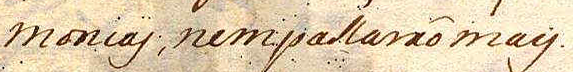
monias, nem passaraõ mais.
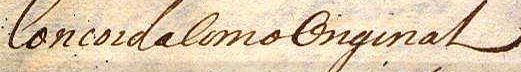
Concorda Com o OriginaL
